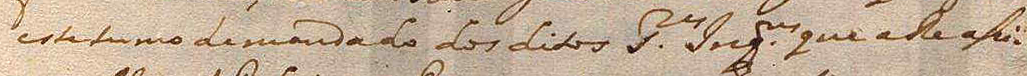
este termo demandado dos ditos s.res Inq.res que a Re assi
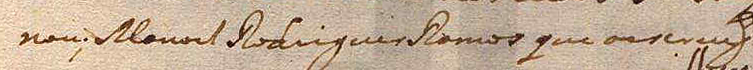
nou, Manoel Rodrigues Ramos que o escreuj:
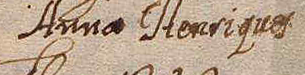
Anna Henriques
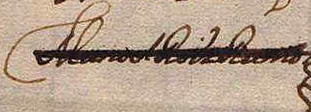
Manoel Roiz̄ Ramos
